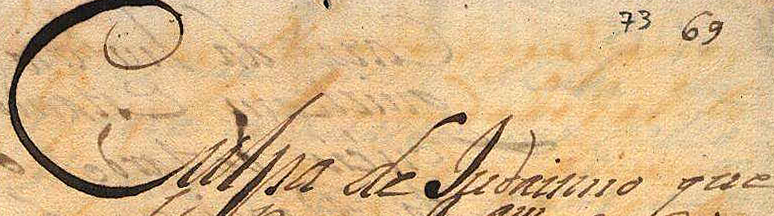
Culpa de Iudaismo que
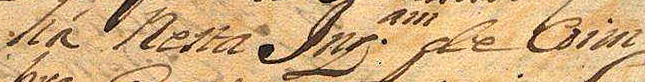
há nesta Inq.am de Coim
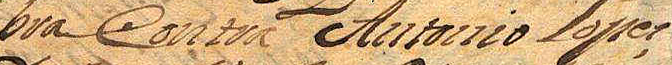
bra Contra Antonio Lopes,
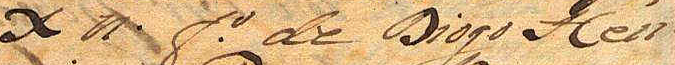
xn. fo. de Diogo Hen
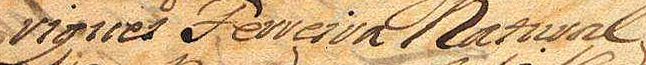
riques Ferreira Natural
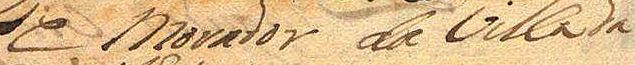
e morador da Villa da
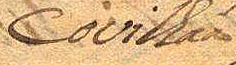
Covilhaã
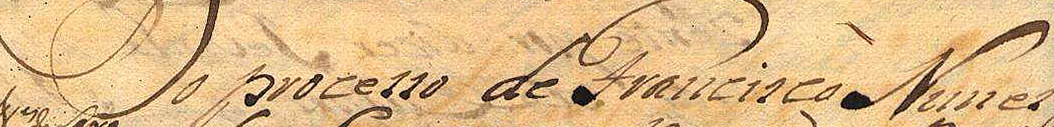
Do processo de Francisco Nunes
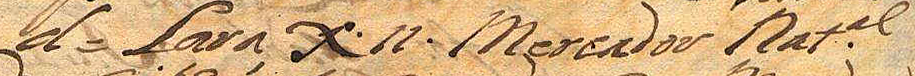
d = Lara, x.n. Mercador Nat.al
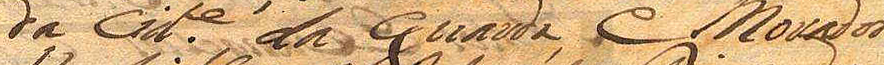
da cid.e da Guarda, e Morador
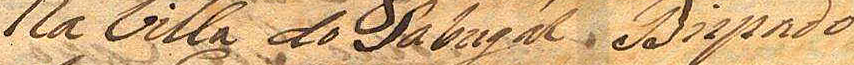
Na Villa do Sabugal Bispado
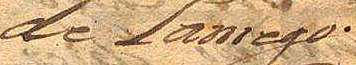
de Lamego.
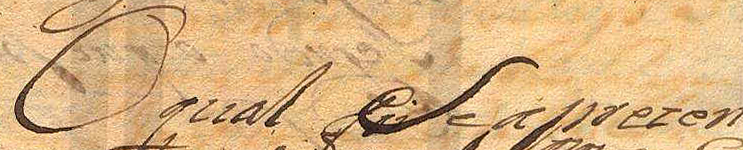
O qual foiSe aprezen
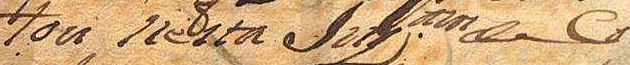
tou nesta Inq.am de Co
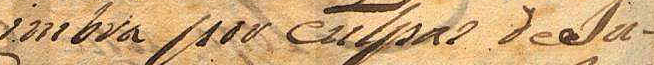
imbra por culpas de Iu
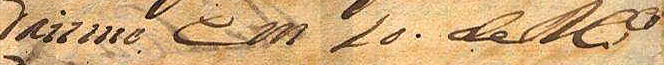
daismo em 10. de M.ço
